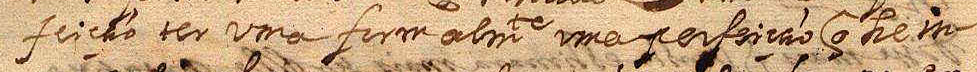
feiçaõ ter vma formalmte vma perfeiçaõ q̄ he in
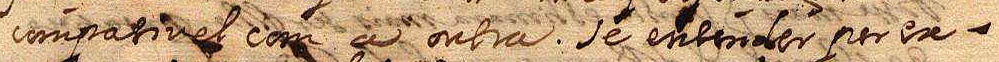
compativel com a outra. se entender por ex
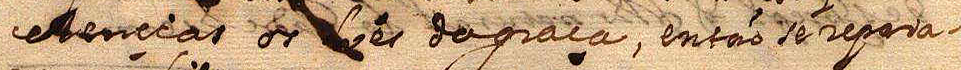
celencias os doẽs da graça, entaõ se repara
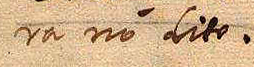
ra no dito.
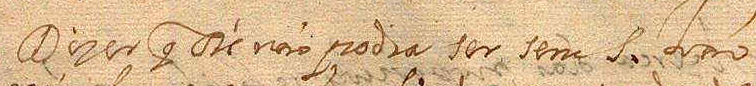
Dizer q̄ Ds̄ naõ podia ser sem S. Ioaõ
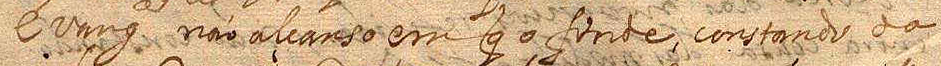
Evang.a naõ alcanso em q̄ ofende, constando da
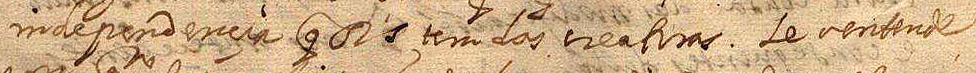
independencia q̄ Ds̄ tem das creaturas. Se o entende
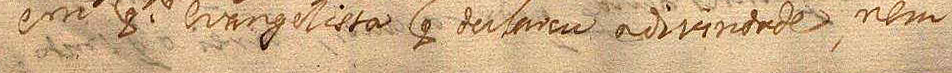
emq̄.to evangelista q̄ declarou a divindade, nem
